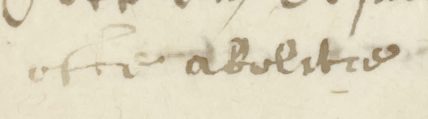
ofte abolitie
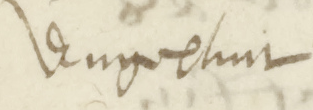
Engelant
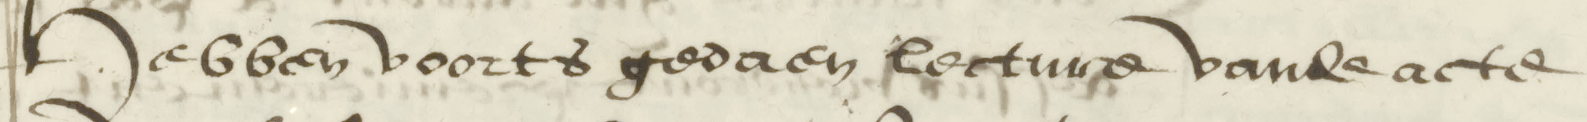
Hebben voorts gedaen lecture vande acte
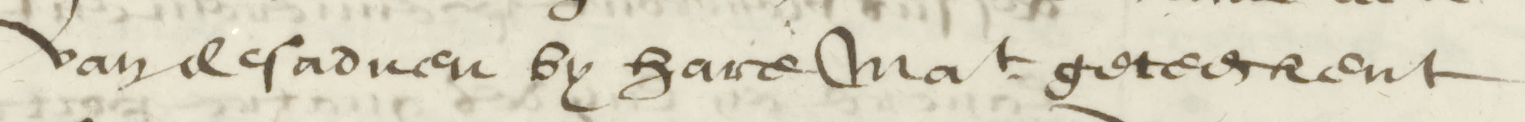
van desadueu by hare Mat. geteeckent
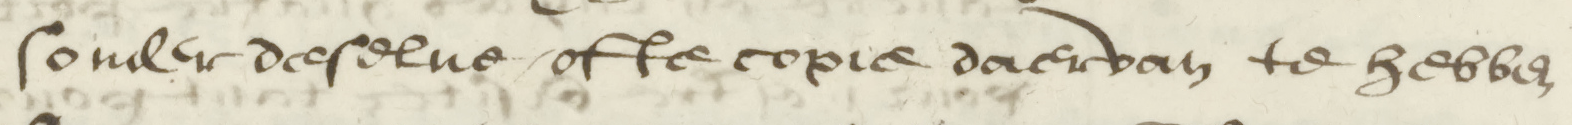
sonder deselue, ofte copie daervan te hebben
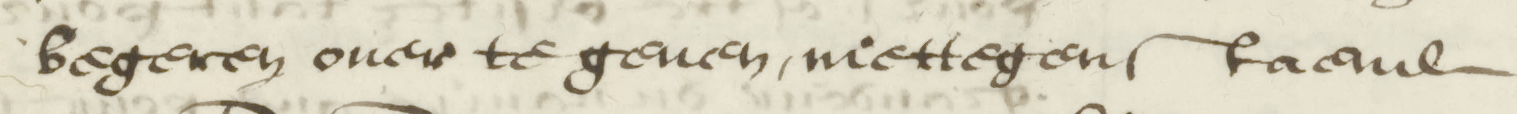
begeren ouer te geuen, niettegenstaende
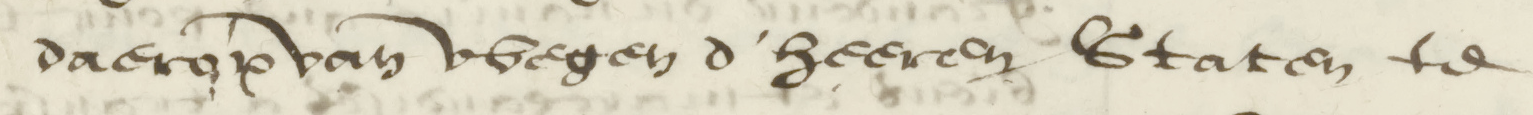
daerop van wegen d'heeren Staten te
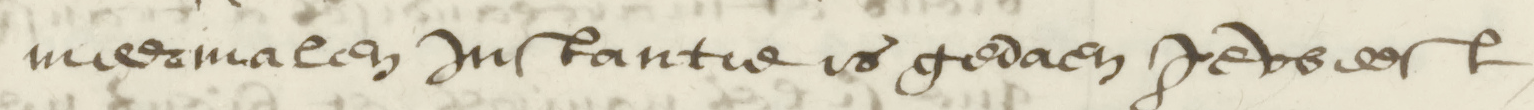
meermalen Instantie is gedaen geweest,
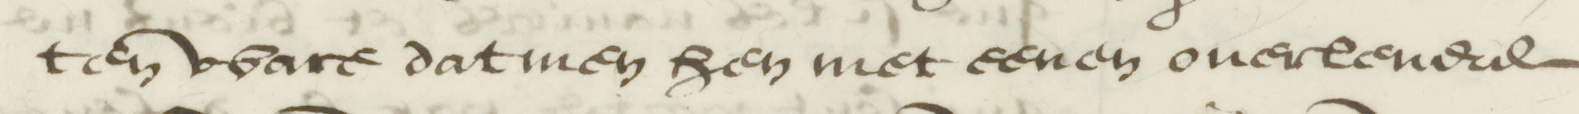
ten ware dat men hen met eenen ouerleuere
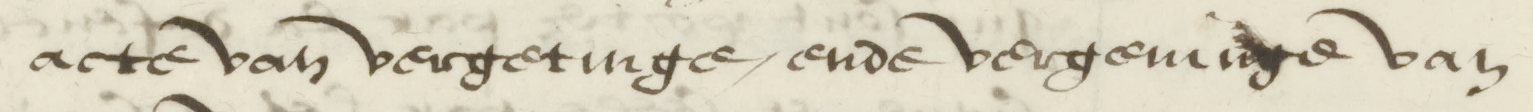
acte van vergetinge, ende vergeuinge van
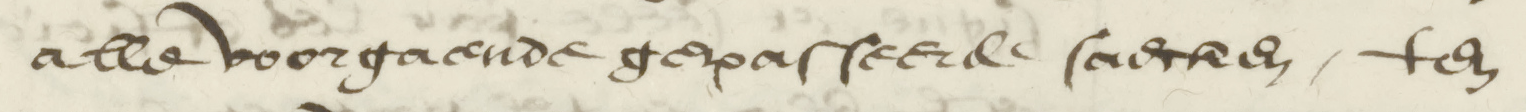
alle voorgaende gepasseerde saecken, ten
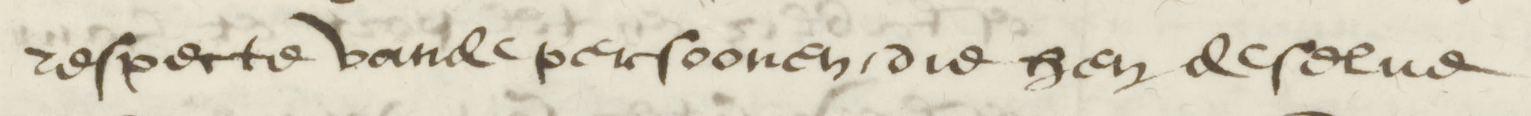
respecte vande persoonen, die hen, deselue
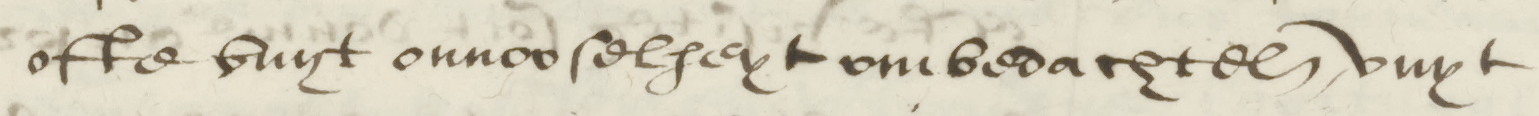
ofte vuyt onnooselheyt ombedachtel, vuyt
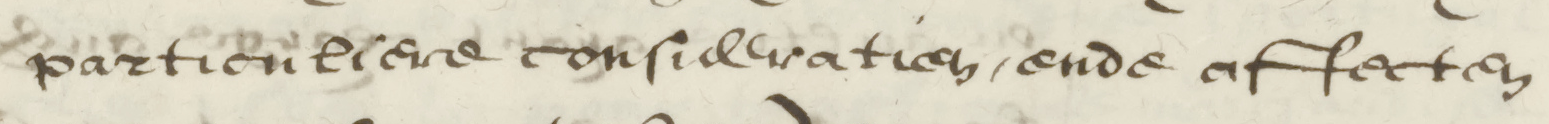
particuliere consideratien, ende affecten
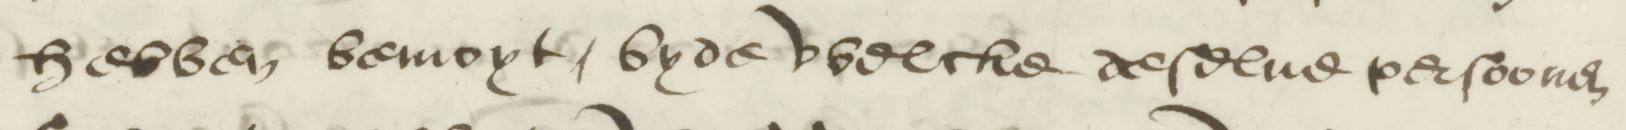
hebben bemoyt, by de welcke deselue persoonen
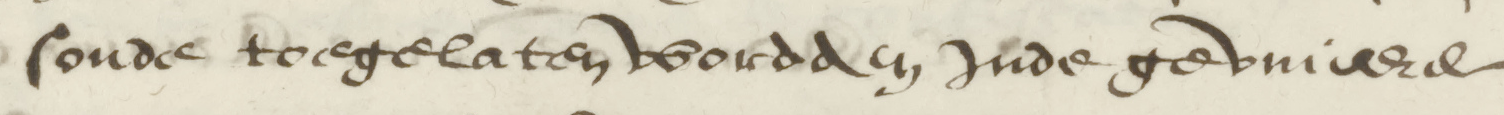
soude toegelaten wordden inde gevnieerde
